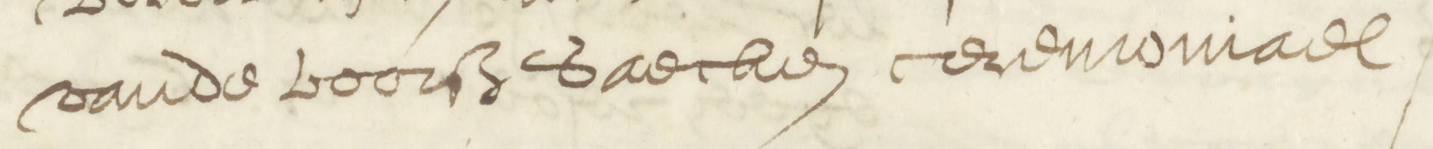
vande voors Saecken ceremoniael
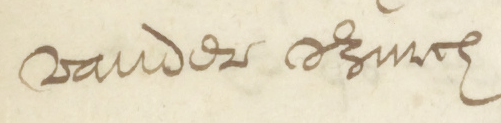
vander Burch
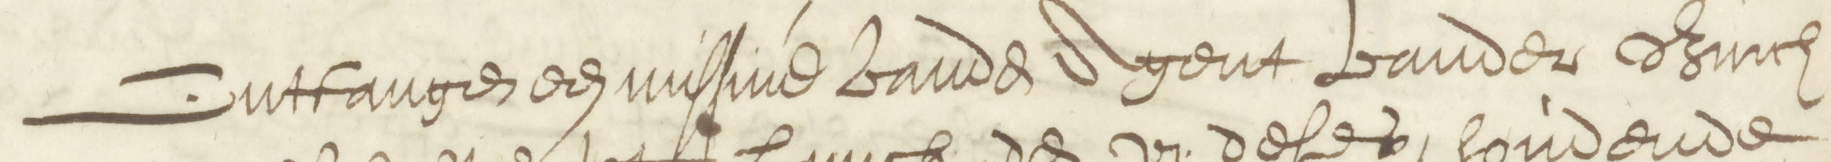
Ontfangen een missiue vanden Agent vander Burch
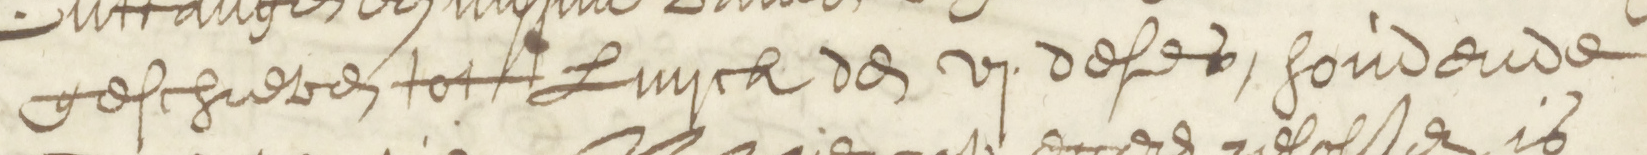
geschreven tot Luyck den vi deses, houdende
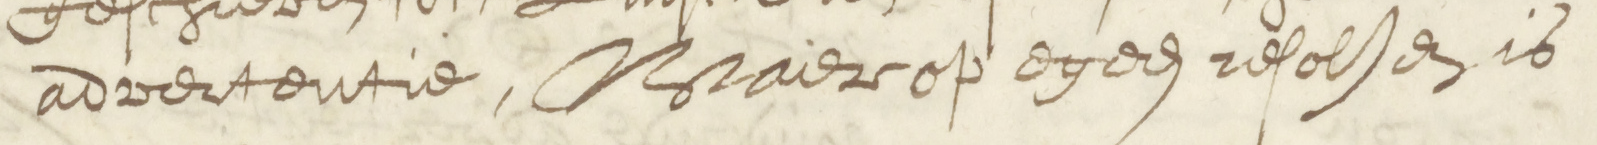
advertentie. Waerop egeen resol en is
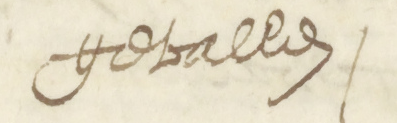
gevallen.
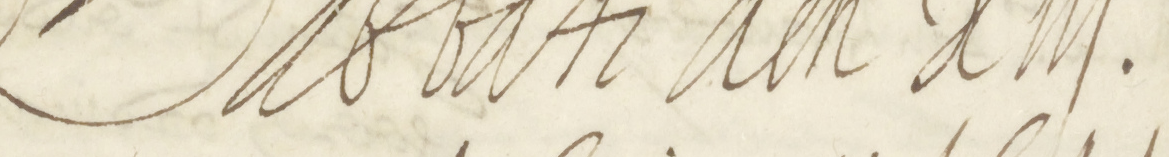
Sabbati den xiij.
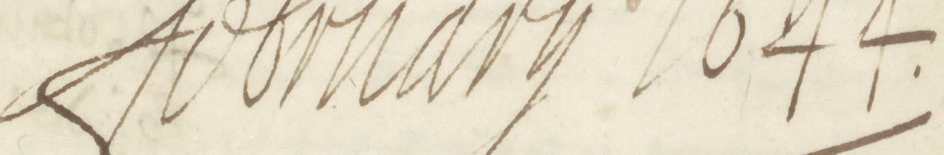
Februarij 1644.
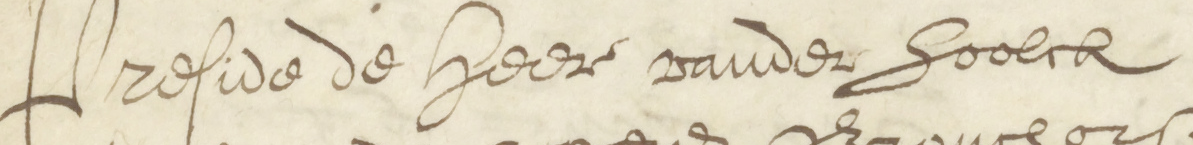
Preside de heer vander Hoolck
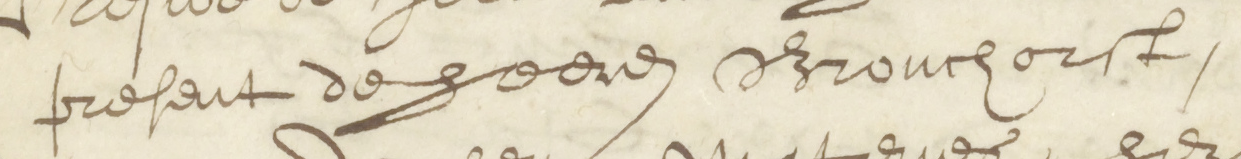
present de heeren Bronchorst,
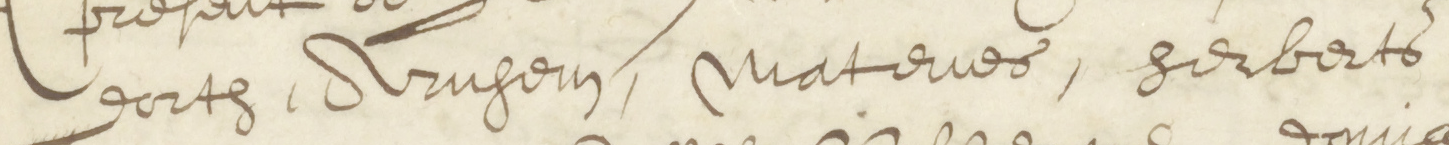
Dorth, Arnhem, Matenes, herberts
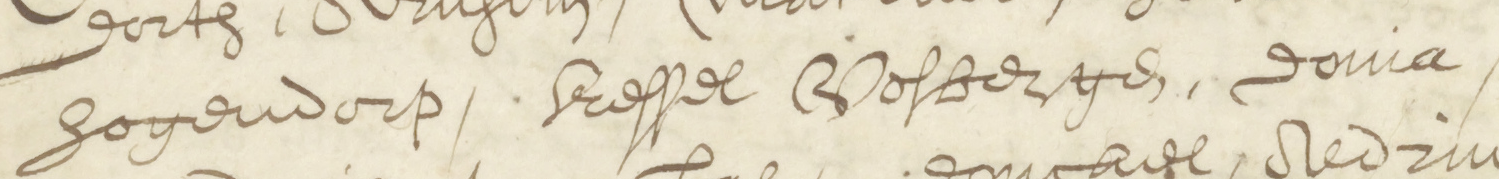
hogendorp, Kessel Vosbergen, Donia
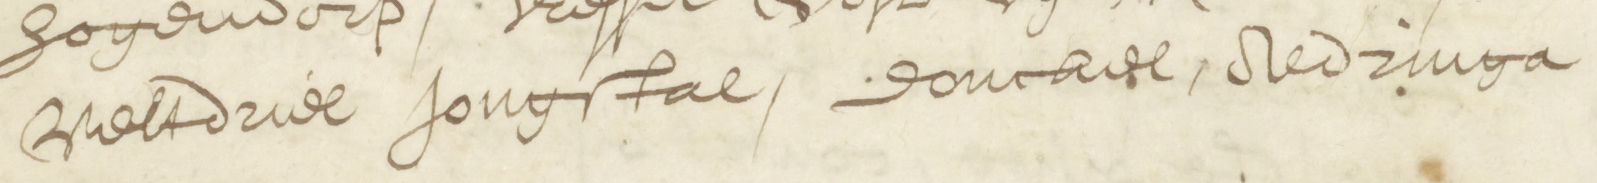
Veltdriel Jongstal, Donckel, Aldringa
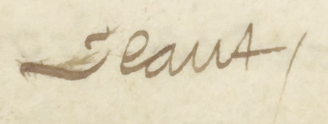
Clant.
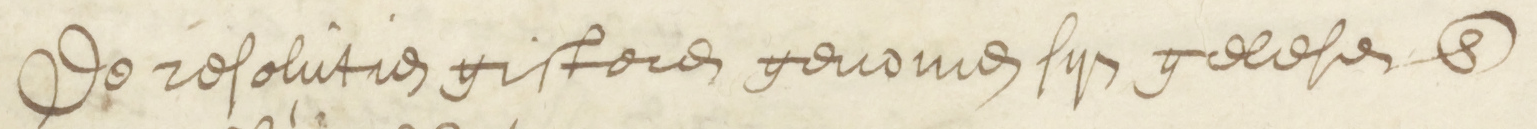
De resolutien gisteren genomen syn gelesen &
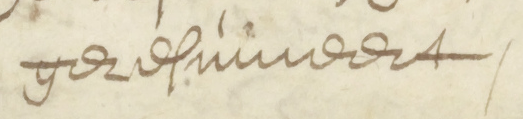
geresumeert.
